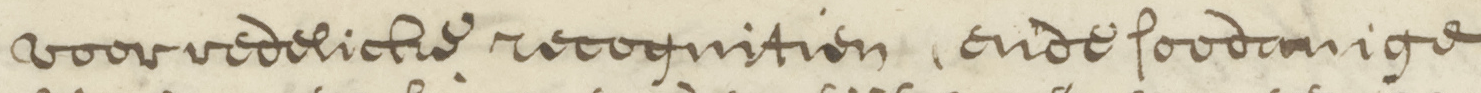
voor redelicke recognitien, ende soodanige
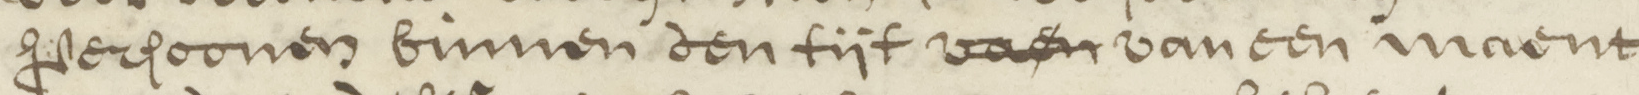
Persoonen binnen den tijt vaen van een maent
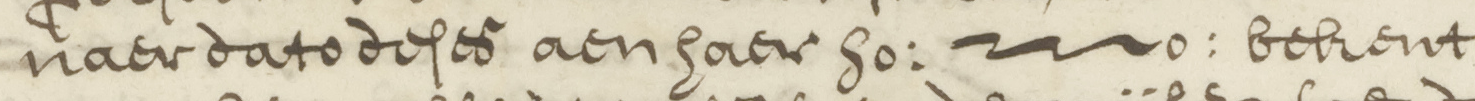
naer dato deses aen haer ho:Mo: bekent
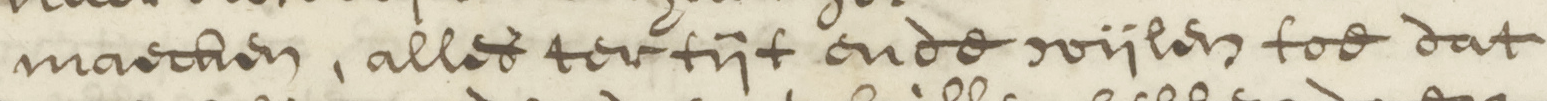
maecken, alles ter tijt ende wijlen toe dat
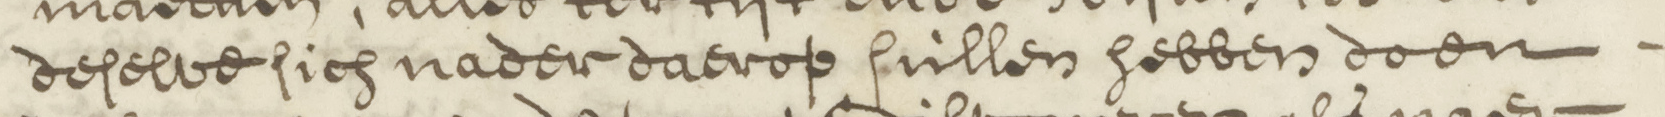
deselve sich nader daerop sullen hebben doen -
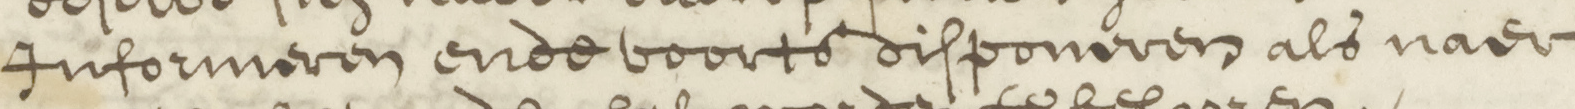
Informeren ende voorts disponeren als naer
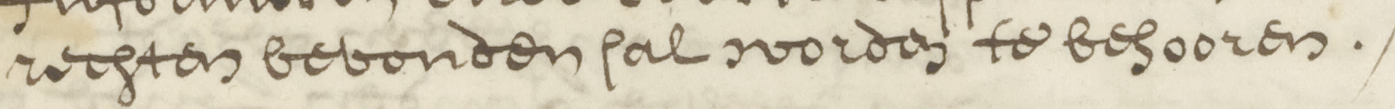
rechten bevonden sal worden te behooren.
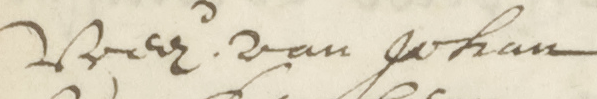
Wede. van Johan
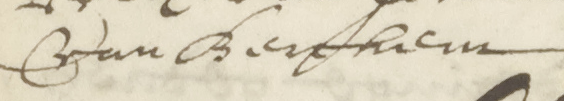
van Berchem
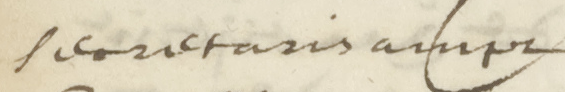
secretaris ampt
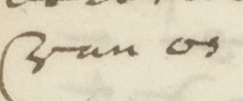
van os.
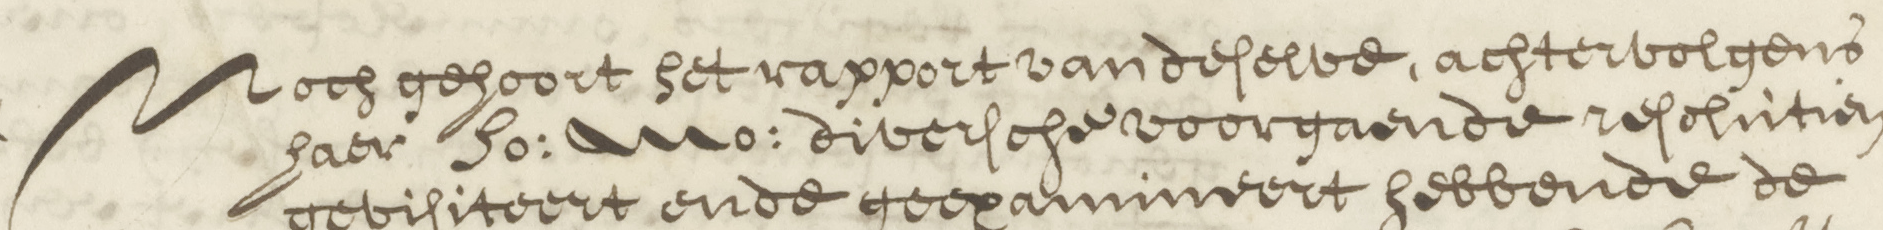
Noch gehoort het rapport van deselve, achtervolgens
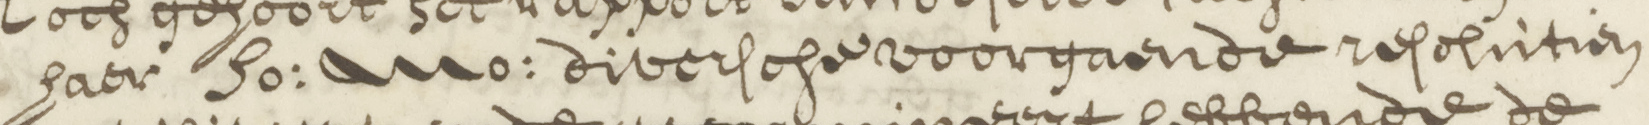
haer Ho:Mo: diversche voorgaende resolutien
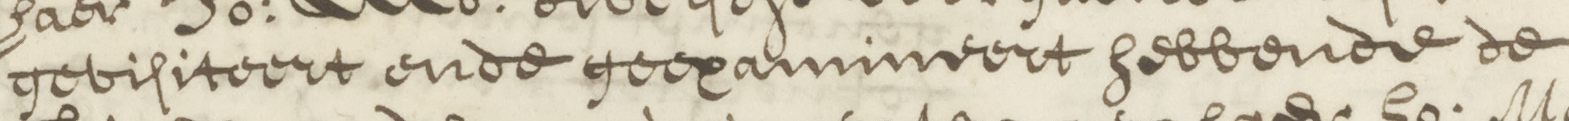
gevisiteert ende geexamineert hebbende de
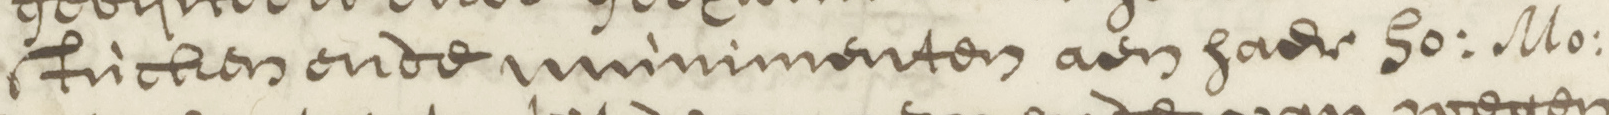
stucken ende munimenten aen haer Ho:Mo:
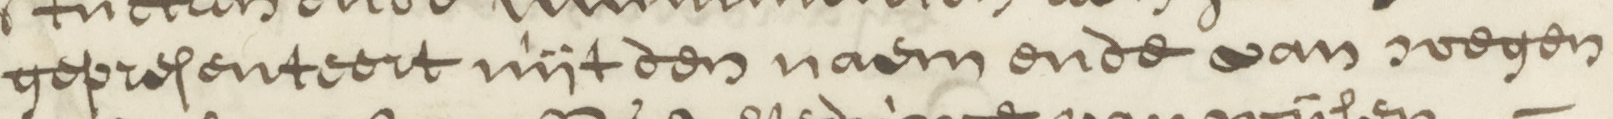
gepresenteert uijt den naem ende van wegen
